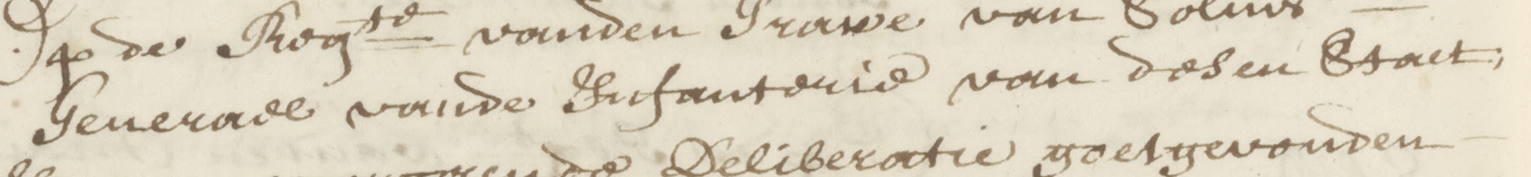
Generael vande Infanterie van desen Staet,
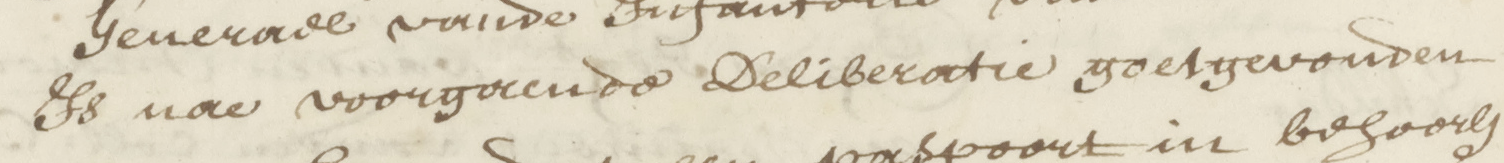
Is nae voorgaende Deliberatie goetgevonden
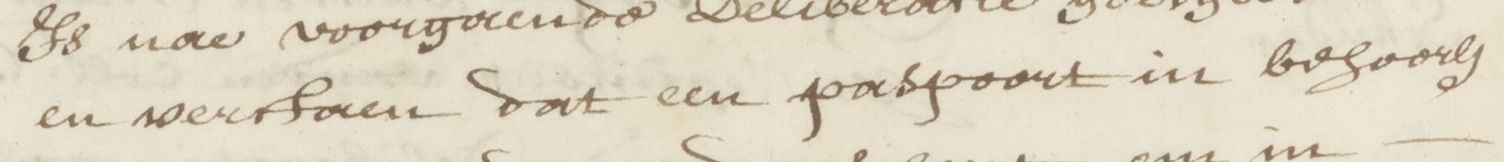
en verstaen dat een paspoort in behoorl
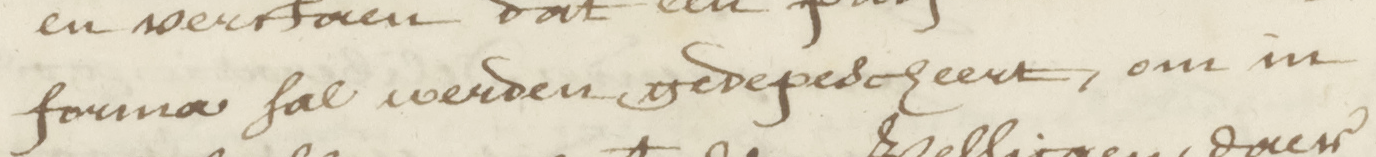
forma sal werden gedepescheert, om in
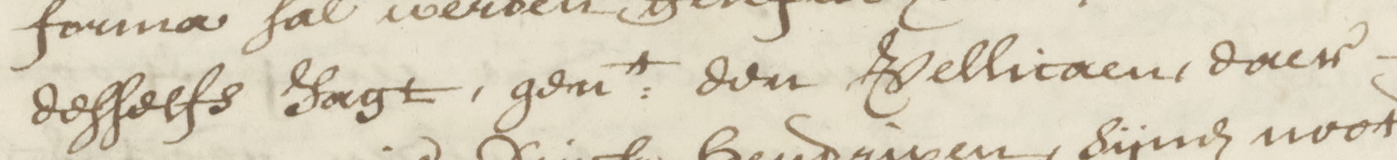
desselfs Jagt, gent. den Pellicaen, daer
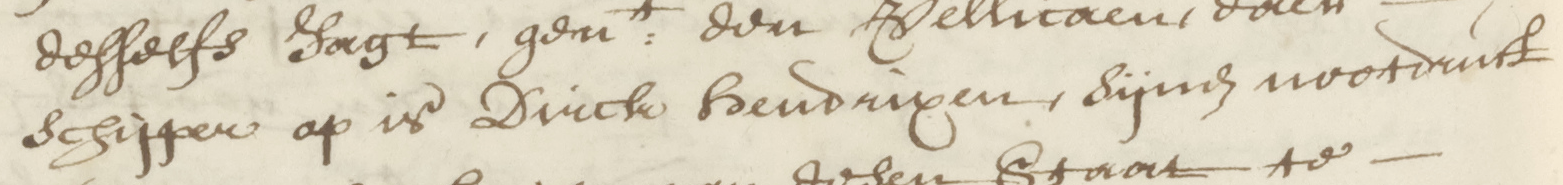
schijpper op is Dirck Hendrixen, sijnen nootdruft
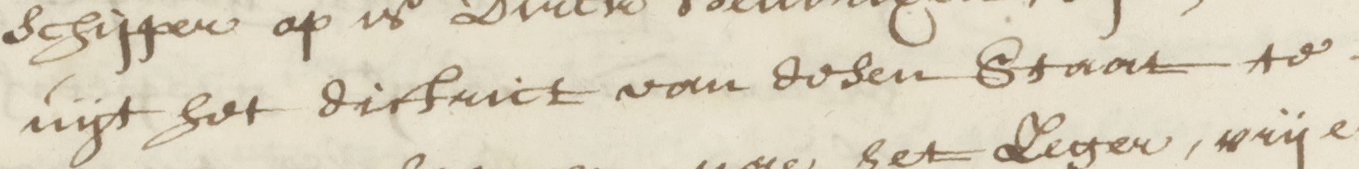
uijt het district van desen Staat te
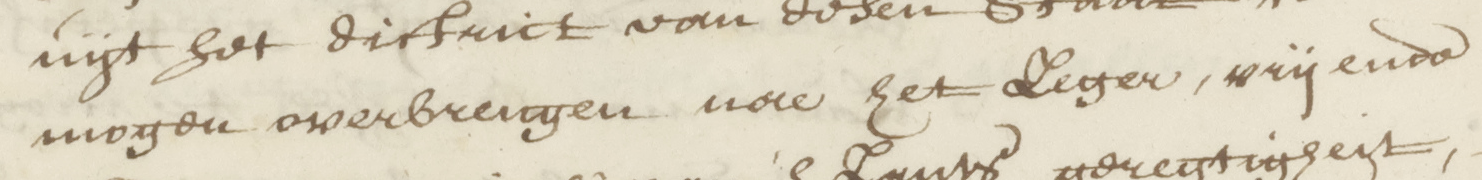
mogen overbrengen nae het Leger, vrij ende
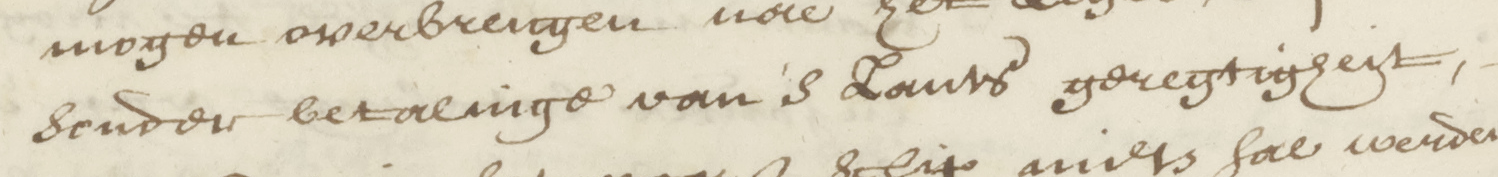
sonder betalinge van ‛s Lants geregtighet,
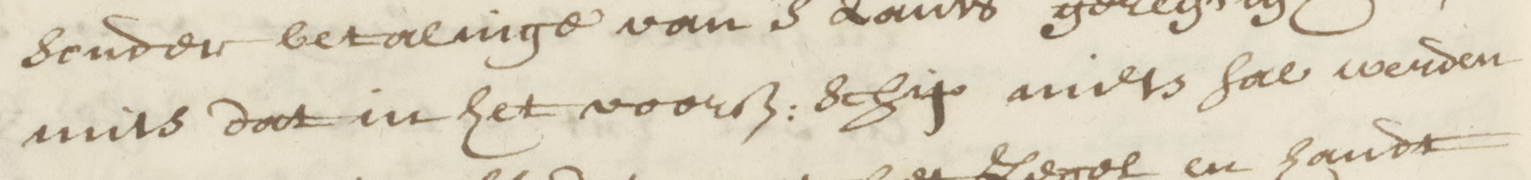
mits dat in het voors: schip niets sal werden
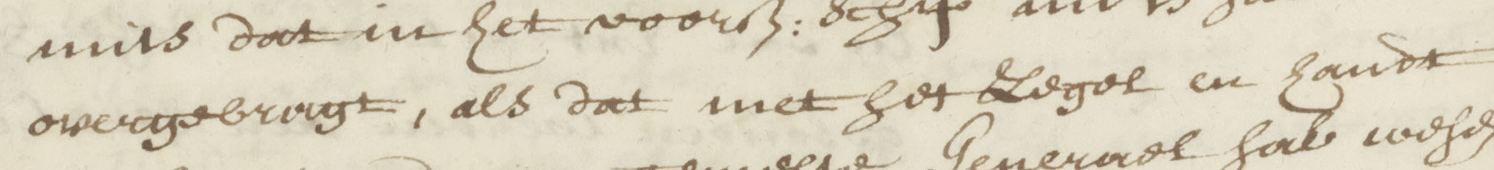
overgebragt, als dat met het zegel en handt
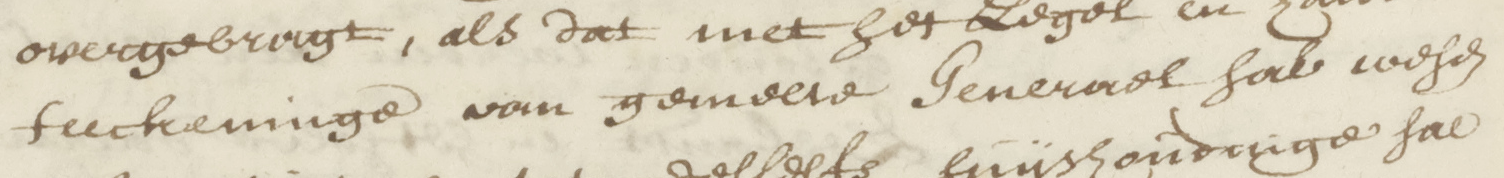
teckeninge van gemelte Generael sal wesen
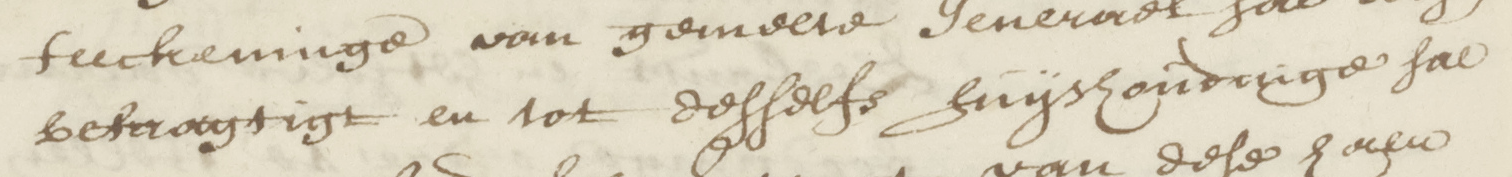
bekragtigt en tot desselfs huijshoudinge sal
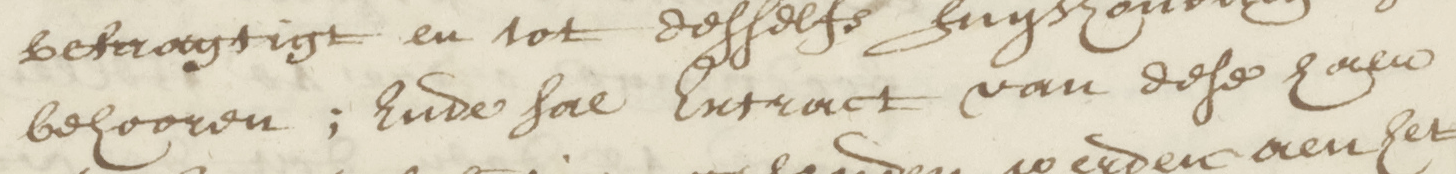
behooren: Ende sal Extract van dese haer
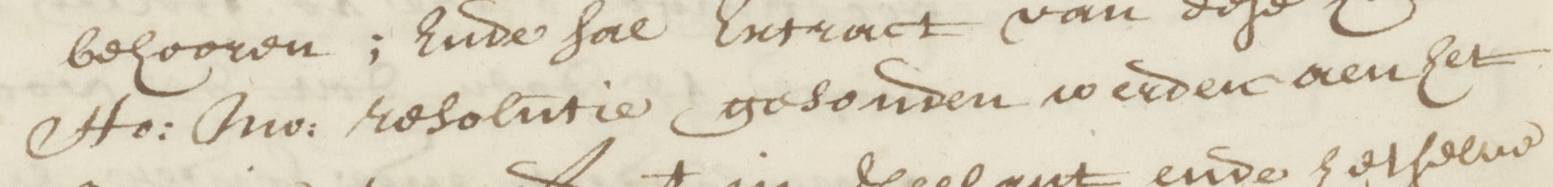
Ho:Mo: resolutie gesonden werden aen het
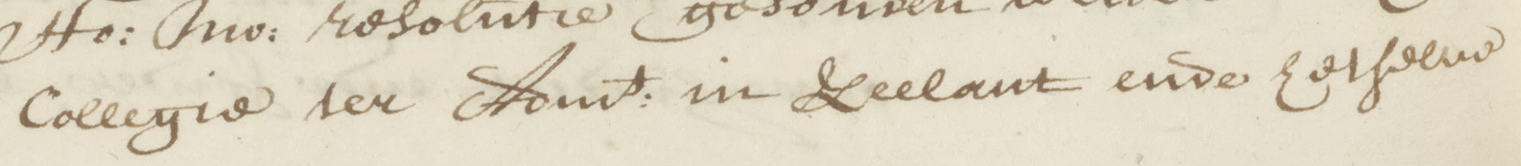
Collegie ter Admt: in Zeelant ende hetselve
